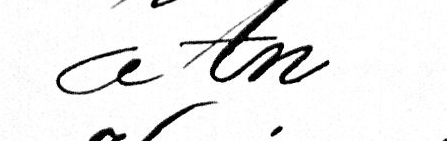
An
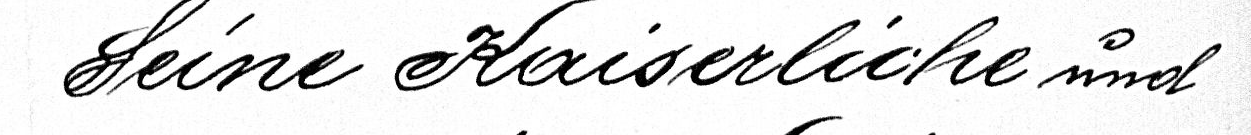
Seine Kaiserliche und
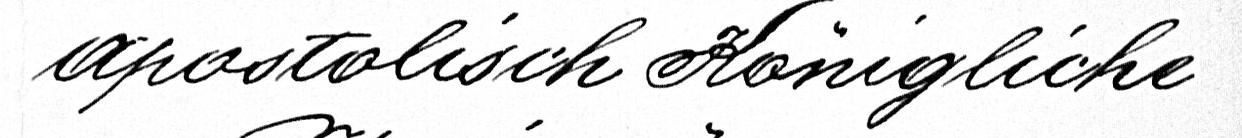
apostolisch Königliche
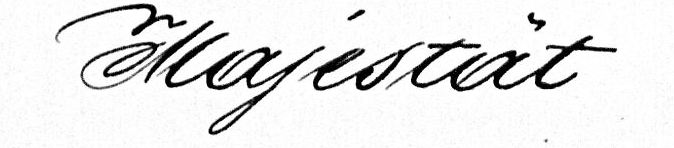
Majestät
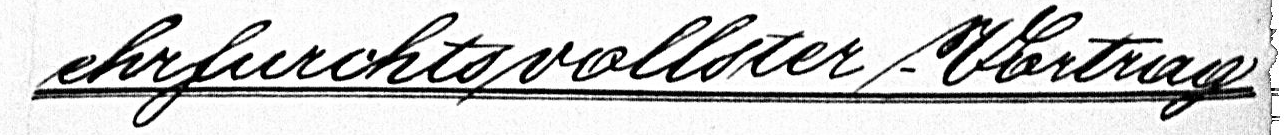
ehrfurchtsvollster-Vortrag
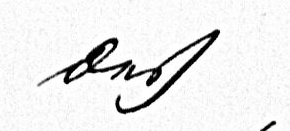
des
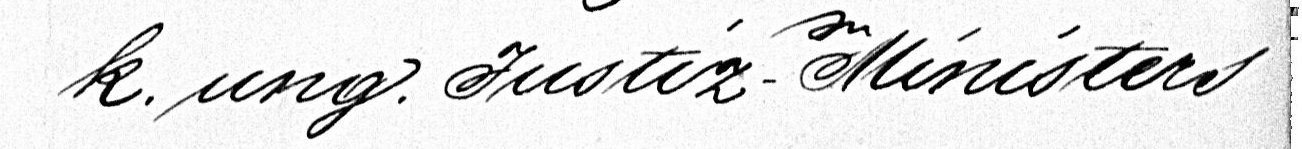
k. ung. Justiz-Ministers
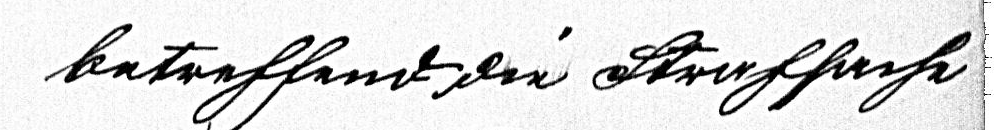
betreffend die Strafsache
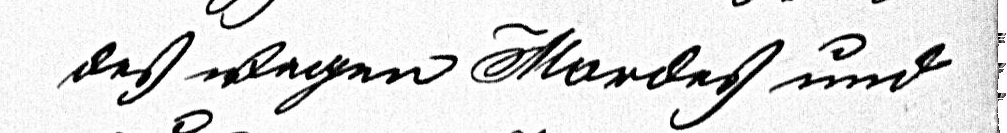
des wegen Mordes und
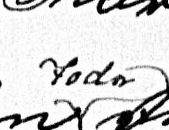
Tode
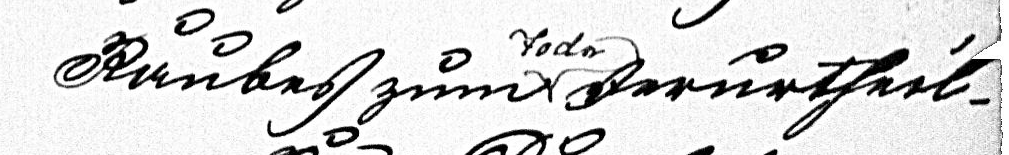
Raubes zum verurtheil¬
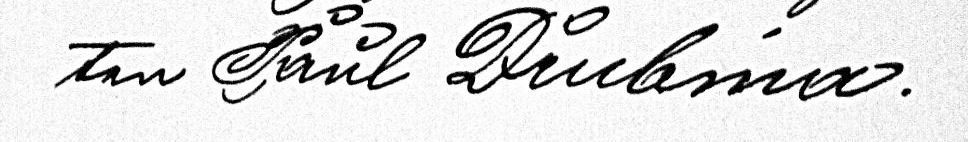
ten Paul Drubina.
